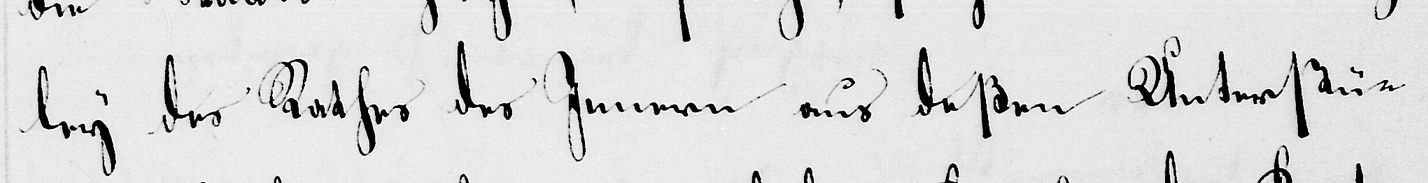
ley des Rathes des Innern aus deßen Unterstü¬
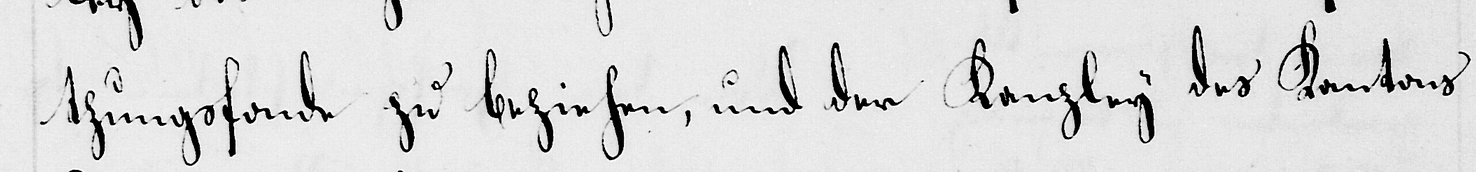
tzungsfonde zu beziehen, und der Kanzley des Kantons
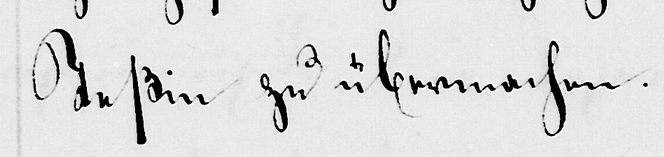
Teßin zu übermachen.
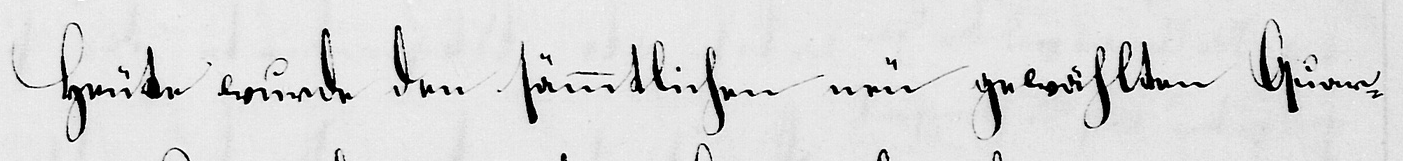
Heute wurde den sämmtlichen neu gewählten Quar¬
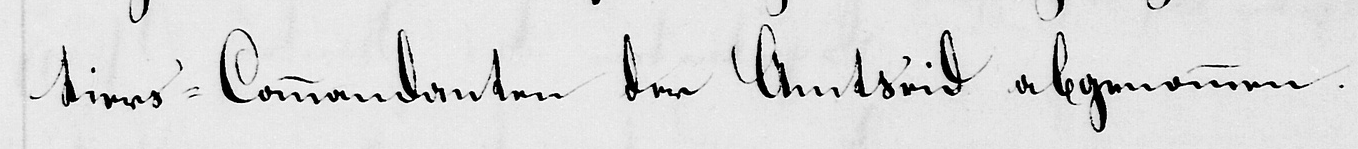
tiers-Commandanten der Amtseid abgenommen.
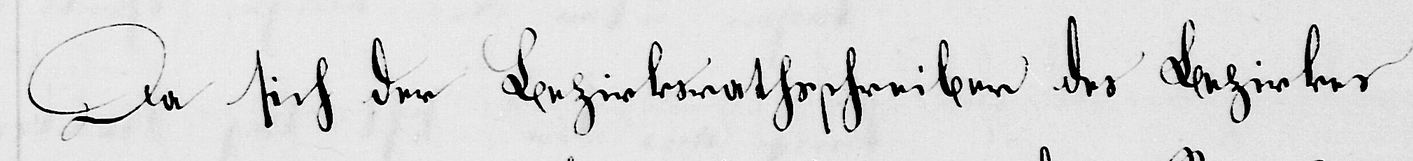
Da sich der Bezirksrathsschreiber des Bezirkes
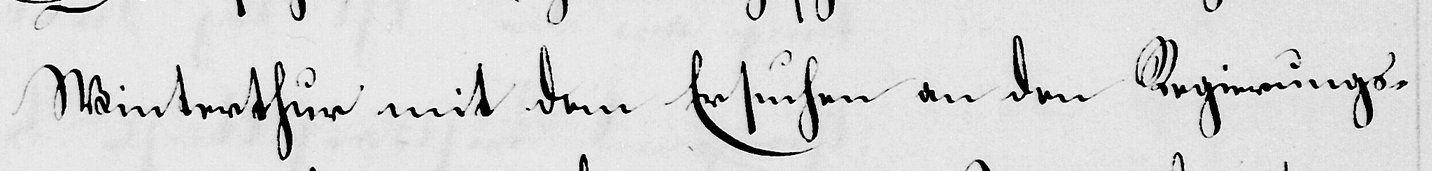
Winterthur mit dem Ersuchen an den Regierungs¬
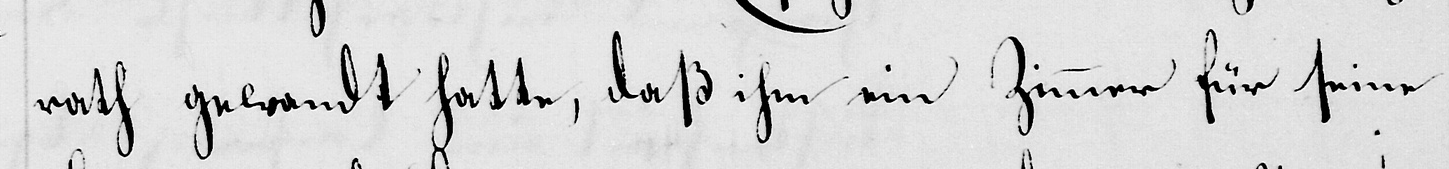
rath gewandt hatte, daß ihm ein Zimmer für seine
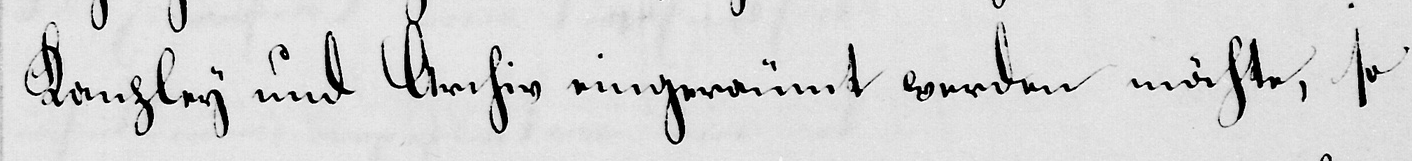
Kanzley und Archiv eingeräumt werden möchte, so
